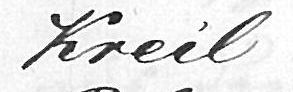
Kreil
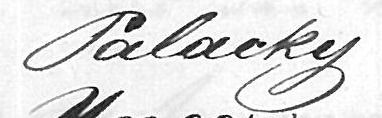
Palacky
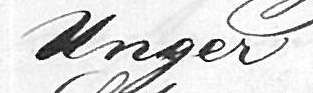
Unger
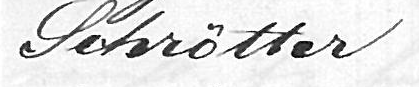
Schrötter
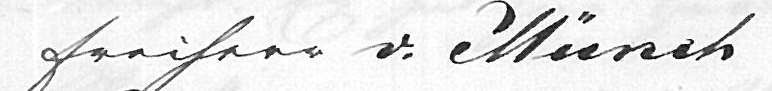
Freiherr v. Münch
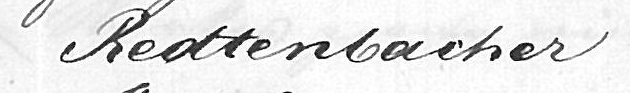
Redtenbacher
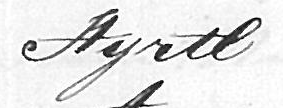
Hyrtl
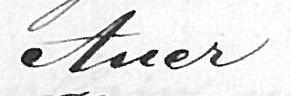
Auer
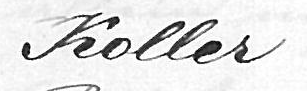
Koller
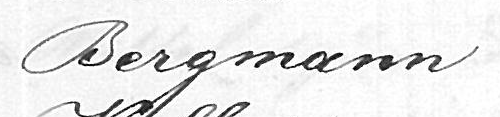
Bergmann
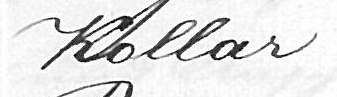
Kollar
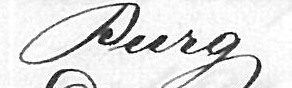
Burg
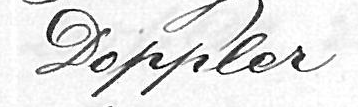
Doppler
